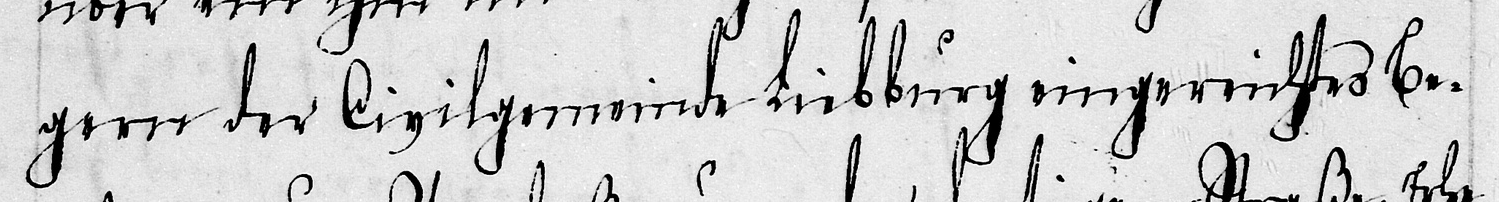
gern der Civilgemeinde Liebburg eingereichtes Be¬
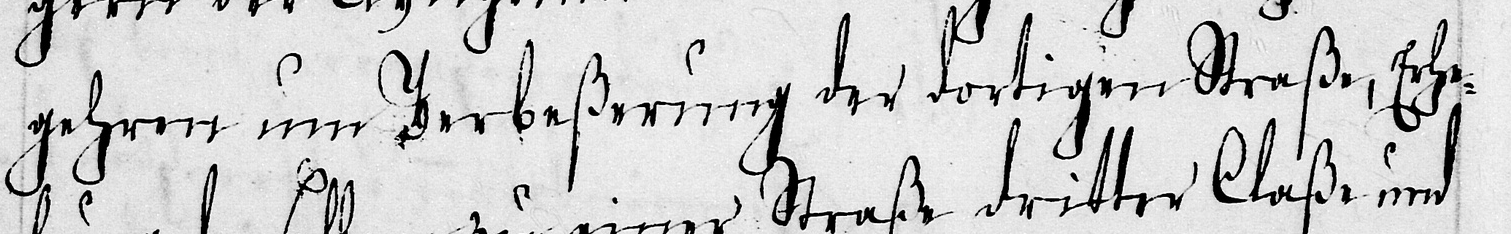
gehren um Verbeßerung der dortigen Straße, Erhe¬
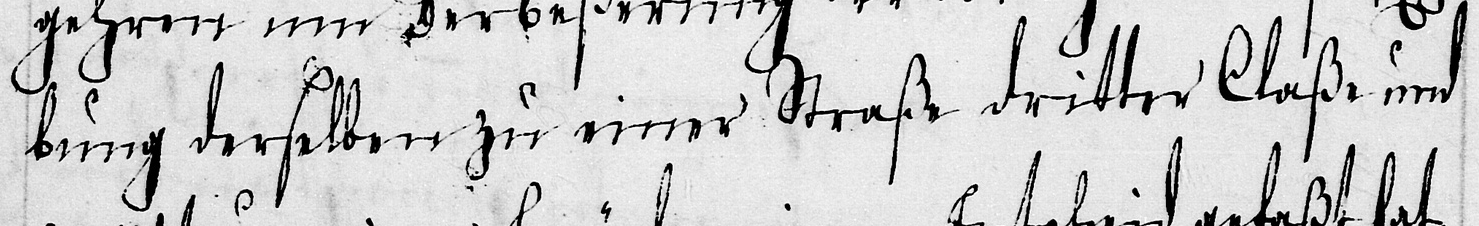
bung derselben zu einer Straße dritter Claße und
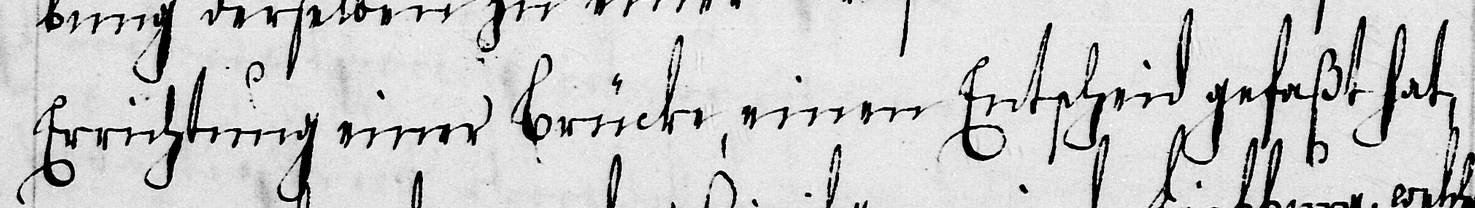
Errichtung einer Brücke, einen Entscheid gefaßt hat,
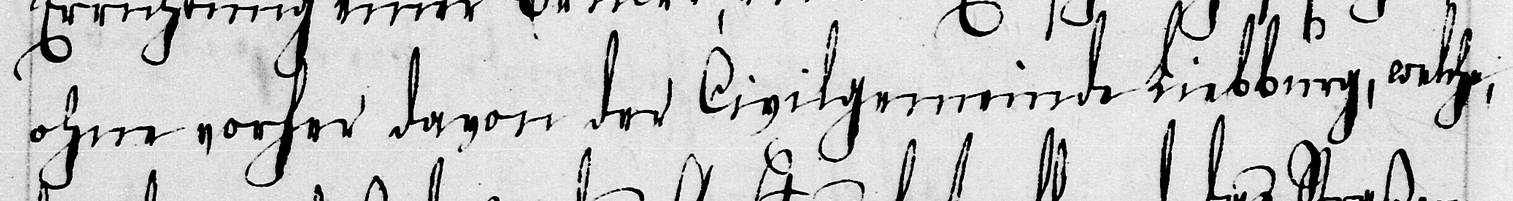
ohne vorher davon der Civilgemeinde Liebburg, welche,
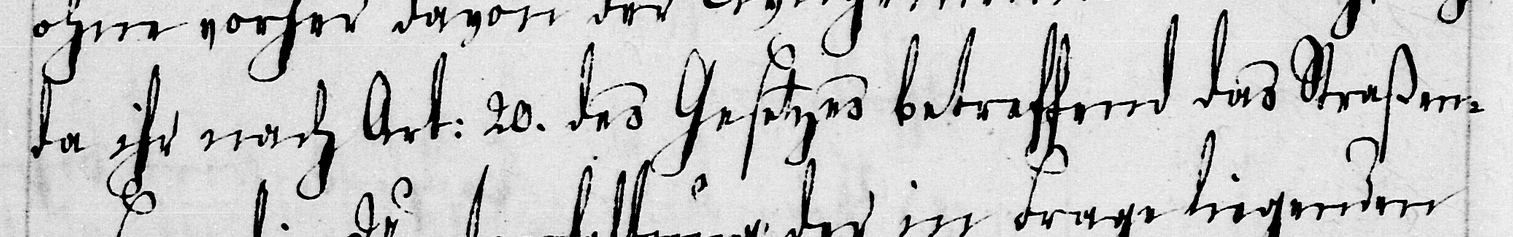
da ihr nach Art: 20. des Gesetzes betreffend das Straßen¬
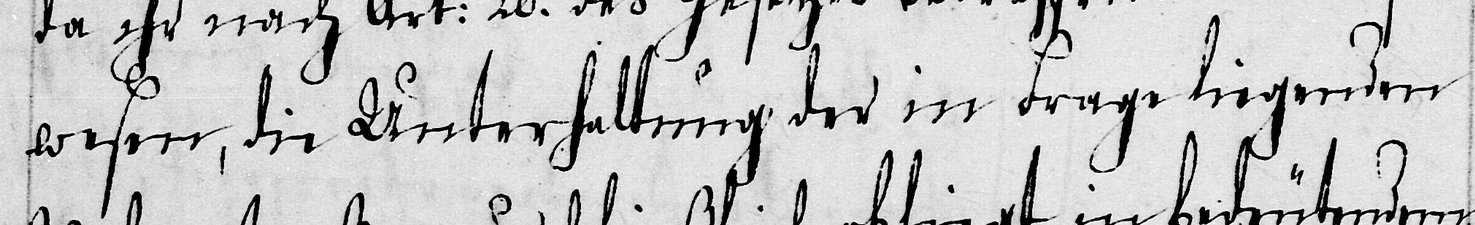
wesen, die Unterhaltung der in Frage liegenden
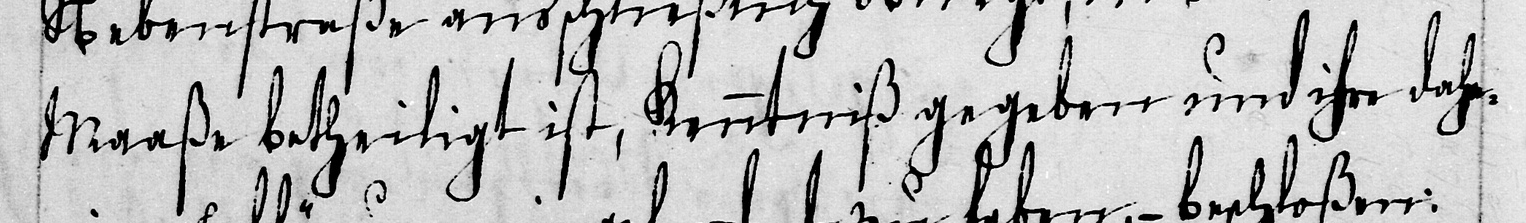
Maaße betheiligt ist, Kenntniß gegeben und ihre dahe¬
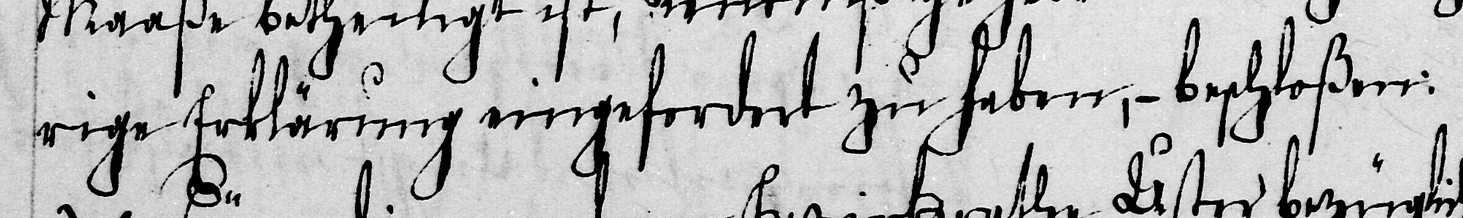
rige Erklärung eingefordert zu haben, – beschloßen:
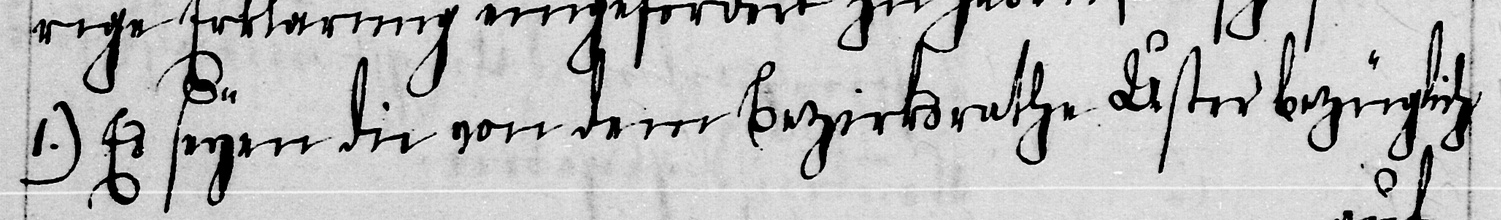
1.) Es seyen die von dem Bezirksrathe Uster bezüglich
